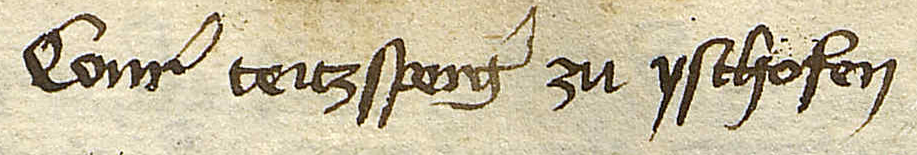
Conr* ceicʒſperg* ʒu yſchofen
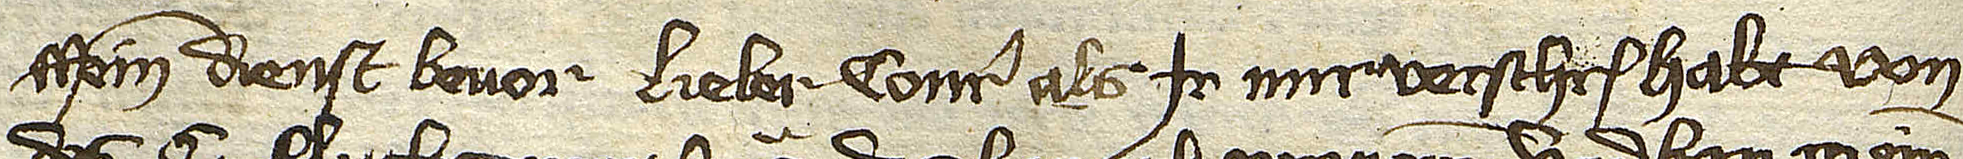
Mein* dienſt beuor Lieber Conr* als Ir mir verſchr* habt von
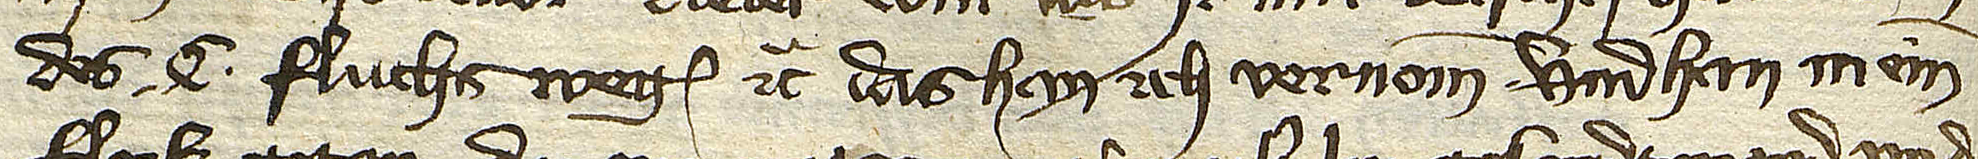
des . C . fluchs weg* ec* das han ich vernom* . Vnd han mein*
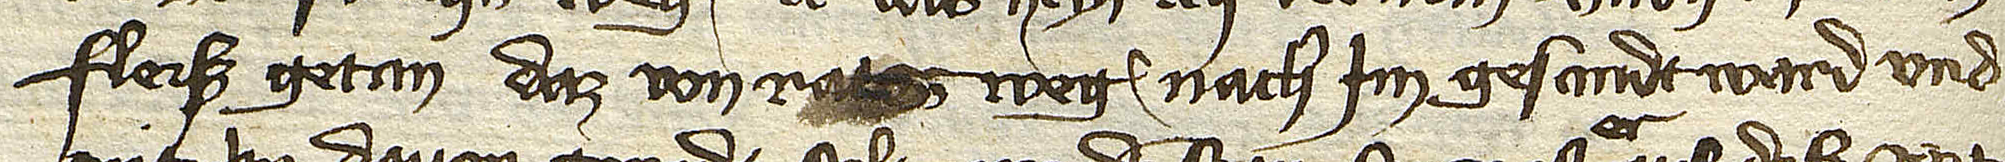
fleiſʒ getan daʒ von rates weg* nach Im geſandt ward vnd
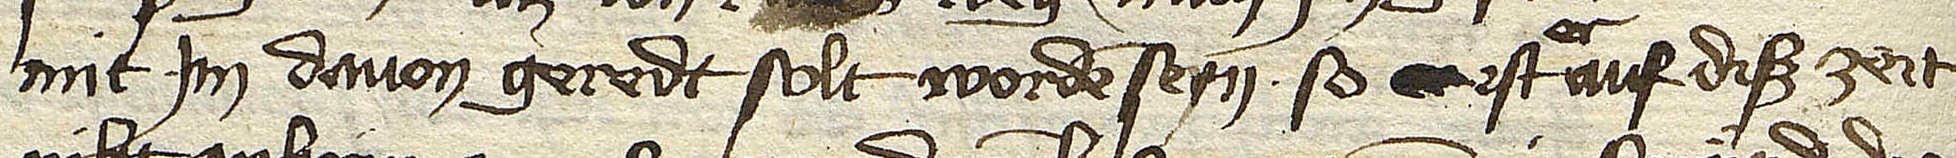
mit Im dauon geredt ſolt worde* ſeyn . ſo er iſt auf diſʒ ʒeit
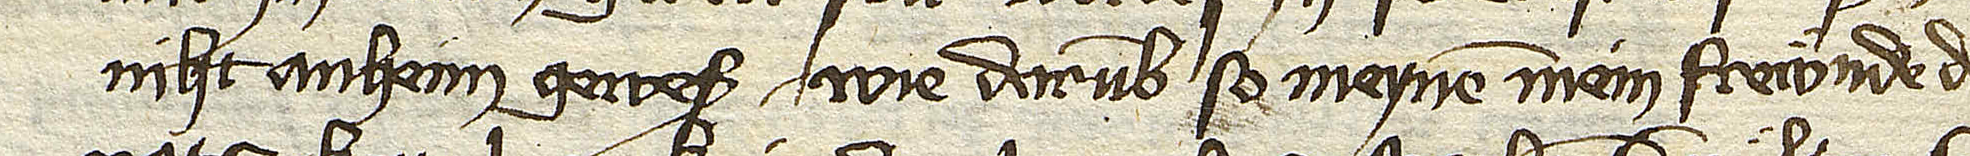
niht anheim geweſ* / wie darub* ſo meyne* mein frewnde des
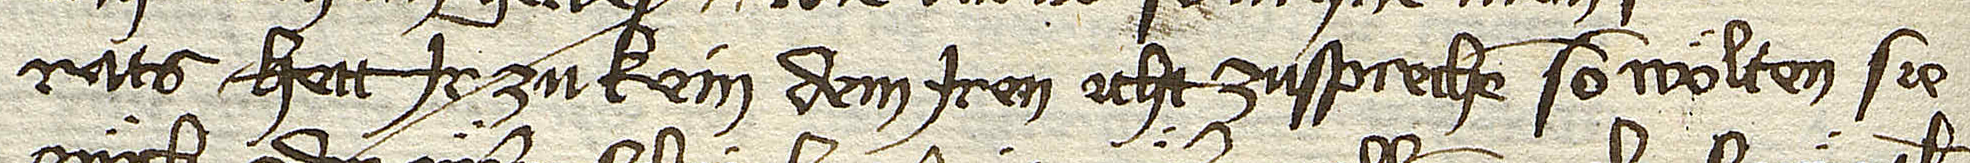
rats / hett Ir ʒu kein dem Iren icht ʒuſpreche* ſo wölten ſie
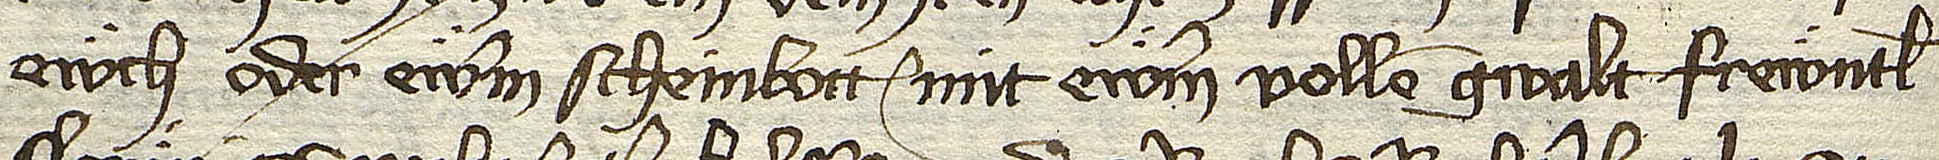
ewch oder ew*m ſcheinbott* mit ewm* volle* gwalt frewntl*
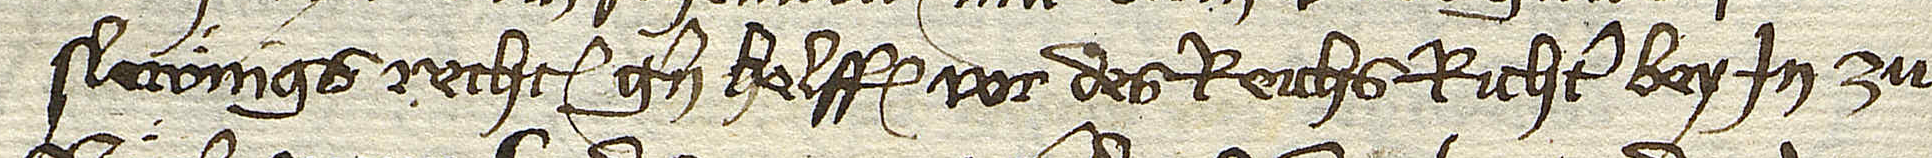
ſlewnigs recht* g*n helff* vor des Reichs Richt* bey In ʒu
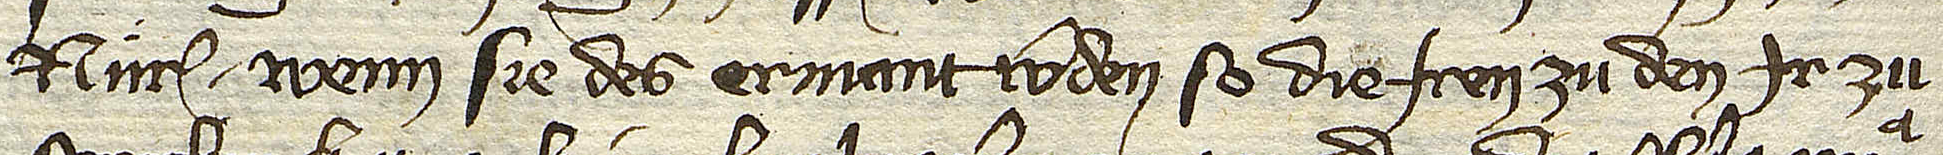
Nür* / wenn ſie des ermant w*den ſo die Iren ʒu den Ir ʒu
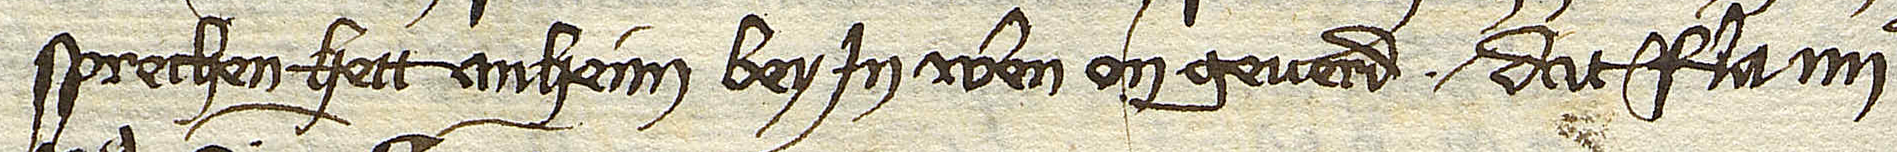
ſprechen hett anheim bey In w*en on geuerd . / dat* fi*a iiii*
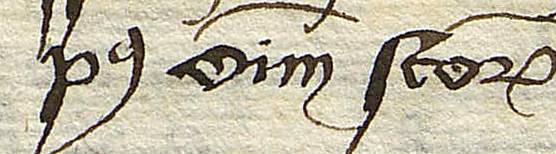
p* Omi* ſco*
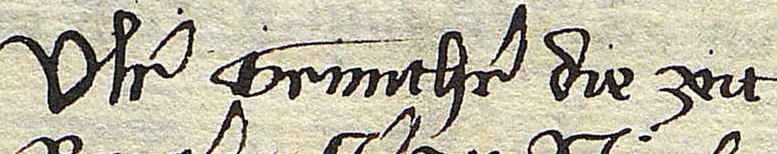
Vlr* Grunthr* die ʒeit
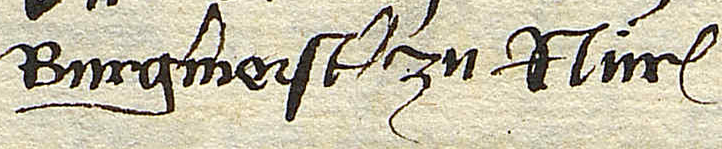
Burg*meiſt* ʒu Nür*
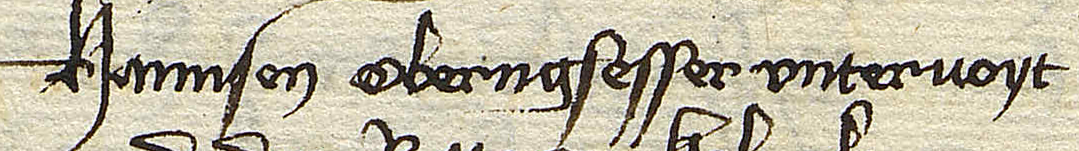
Hannſen Oberngſeſſer vnteruoyt
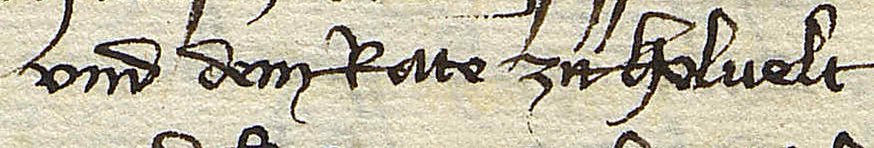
vnd dem Rate ʒu Holuelt
